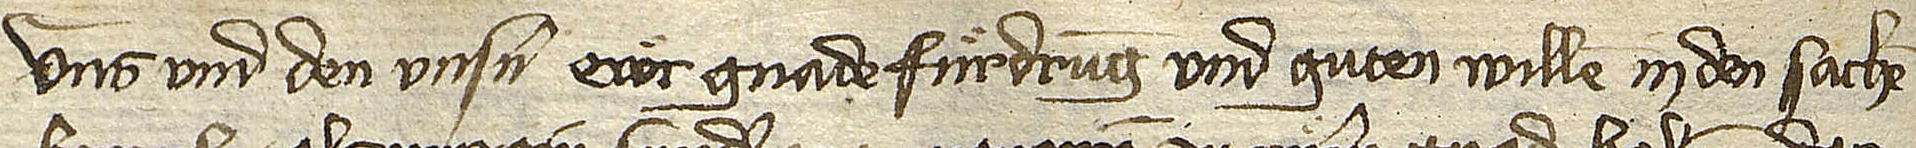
Vns vnd den vnſn* eẅr gnade fürdru*g vnd guten wille in den ſache*
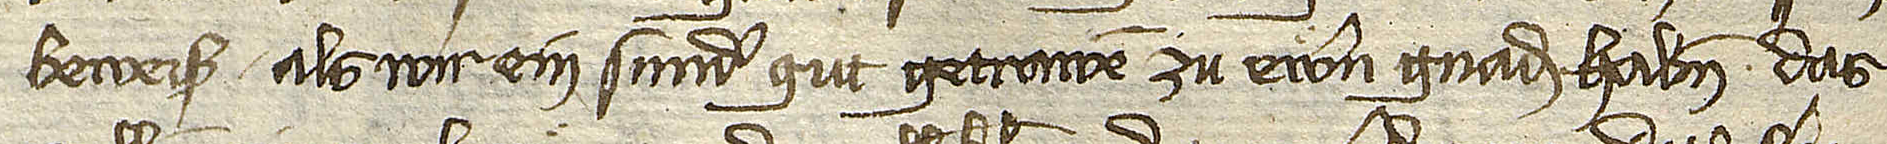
beweiſ* / als wir ein ſund* gut getrawe* ʒu eẅ*n gnad* habn* . das
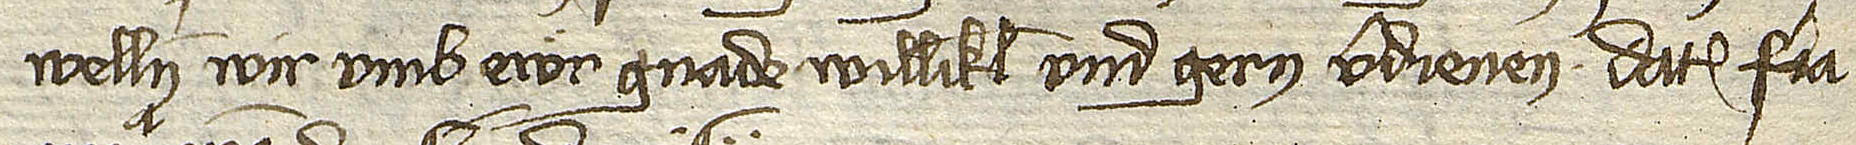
welln* wir vmb eẅr gnade willikl* vnd gern v*dienen . Dat* fi*a
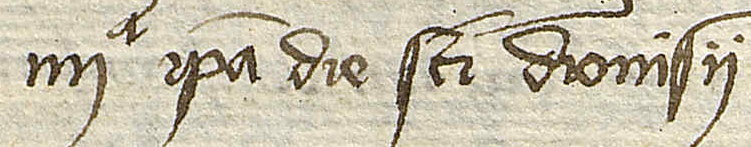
iiii* ipa* die ſci* dioniſii
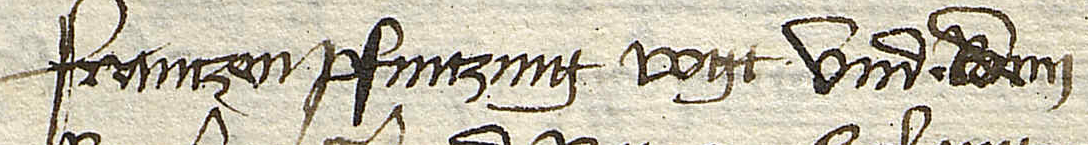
Francʒen pfincʒing vogt Vnd Dem
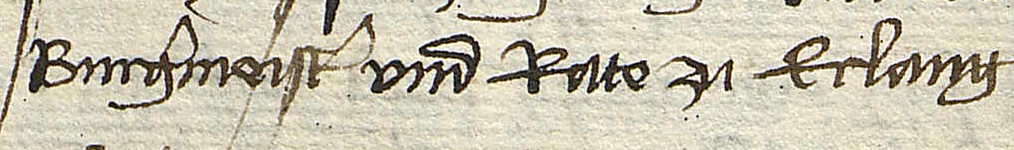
Burg*meiſt* vnd Rate ʒu Erlang
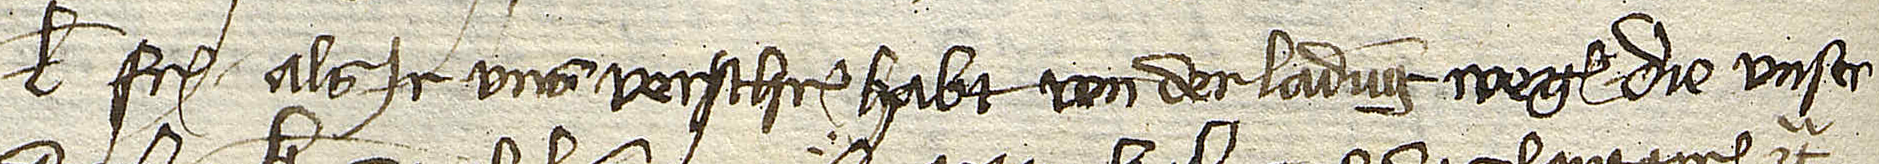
L* fr* / als Ir vns verſchr* habt von der ladu*g weg* / Die vnſer
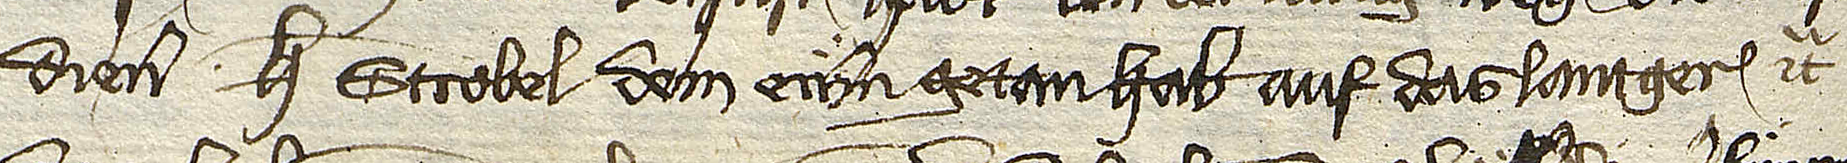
dien* . H* Strobel dem eẅ*n getan hab auf das lantger* ec*
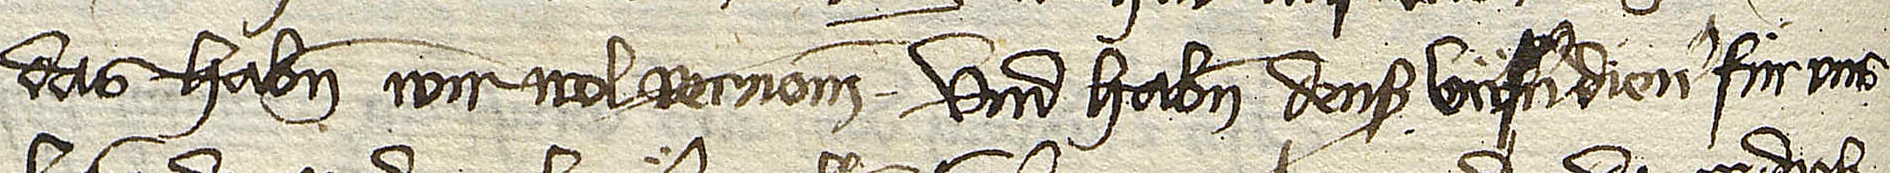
das habn* wir wol vernom* / Vnd habn* denſ* eẅ*n dien* für vns
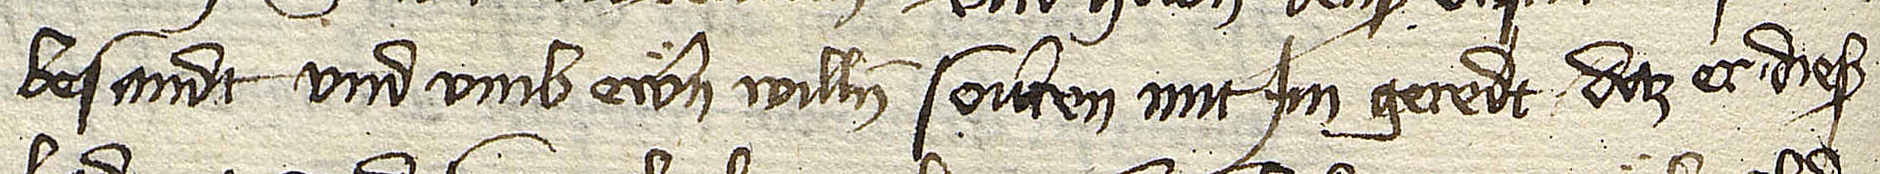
beſandt vnd vmb eẅ*n willn* ſou*ren mit Im geredt / faʒ er dieſ*
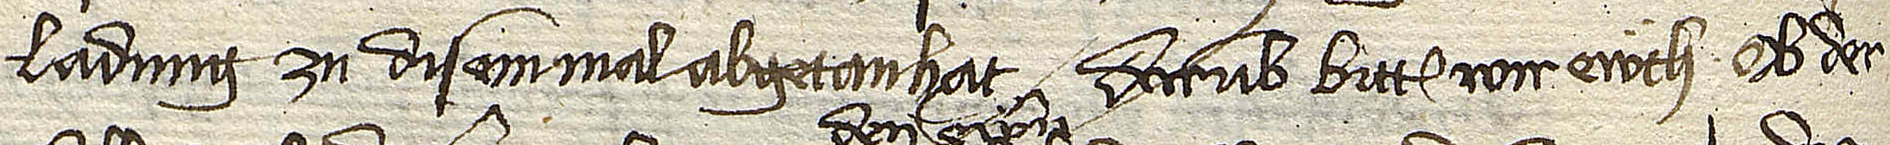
ladung ʒu diſem mal abgetan hat / Darub* bitt* wir eẅch Ob der
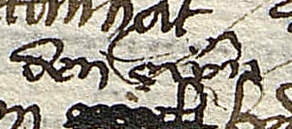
den eẅ*n
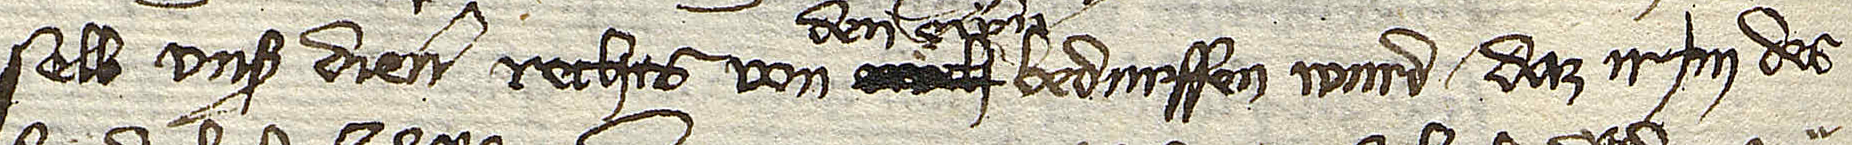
ſelb vnſ* dien* rechts von eẅch bedurffen wurd / faʒ ir Im des
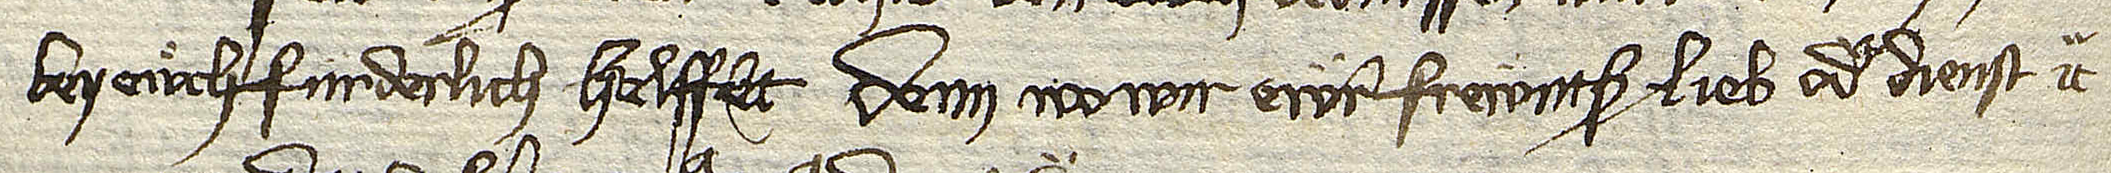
bey eẅch furderlich helffet Denn wo wir eẅr* freẅntſ* lieb od* dienſt ec*
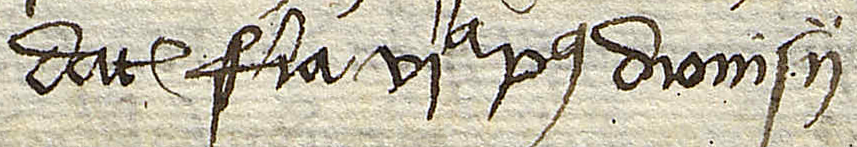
Dat* fi*a vi* p* dioniſii
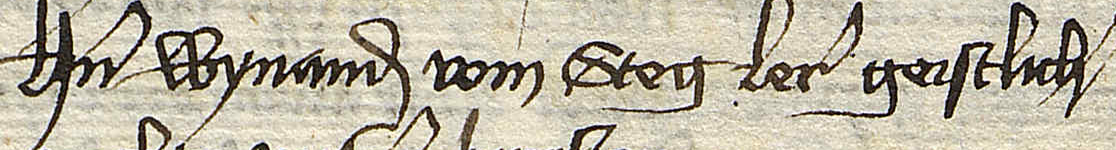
Hn* Wynand* vom Steg Ler* geiſtlich*
